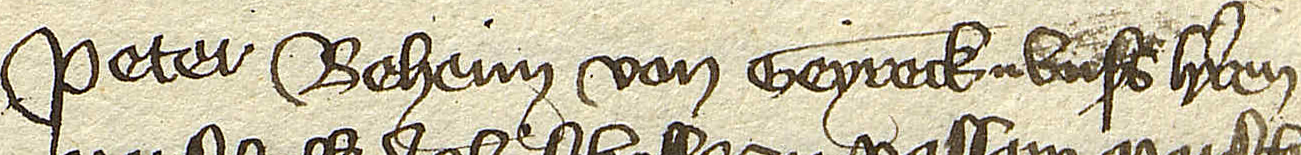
Peter Beheim von Geyreck ~ vnſ*s h*ren
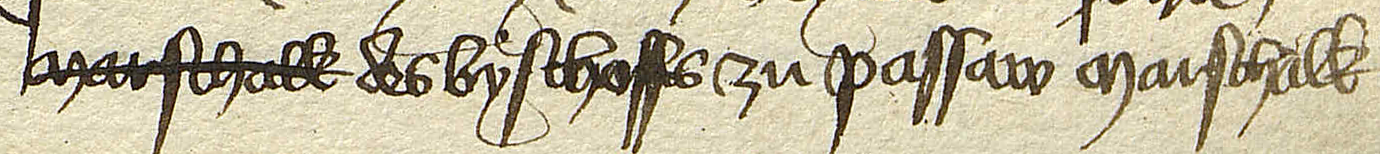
Marſchalk des byſchoffs cʒu Paſſaw Marſchalk
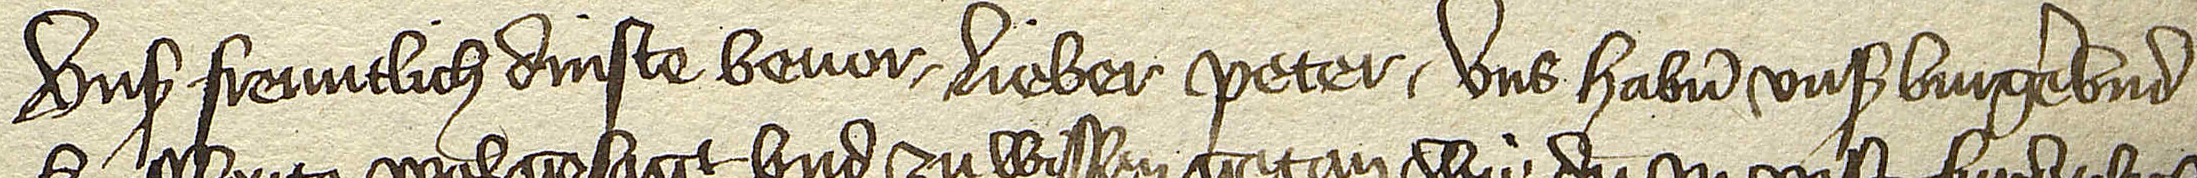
Vnſ* freuntlich dinſte beuor / lieber Peter / Vns habn* vnſ* burge* vnd
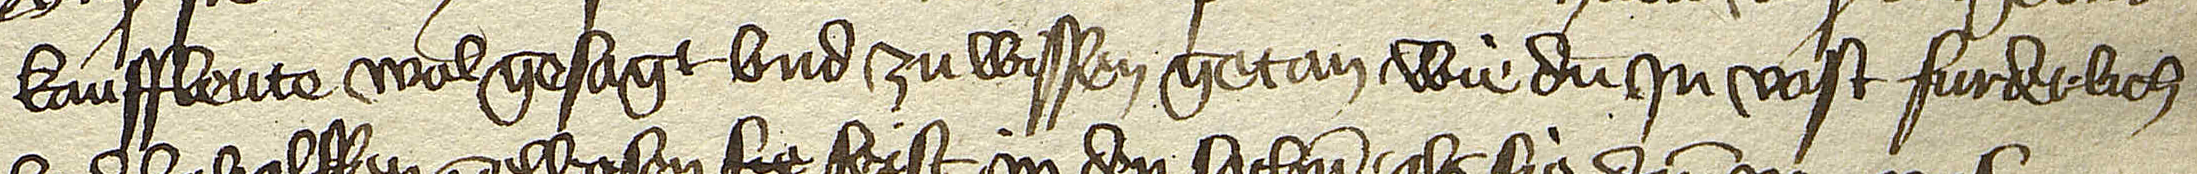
kauffleute wol geſagt vnd cʒu wiſſen getan / wie du In vaſt furderlich
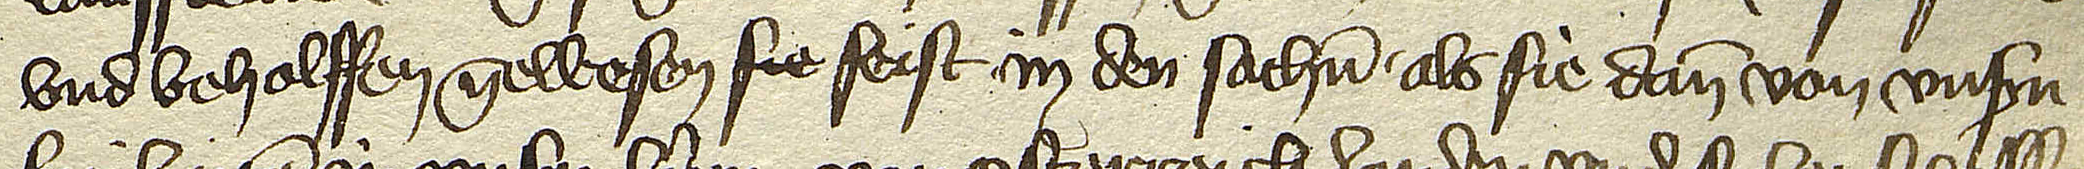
vnd beholffen geweſen ſie ſeiſt in den ſachn* / als ſie dan* von vnſ*n
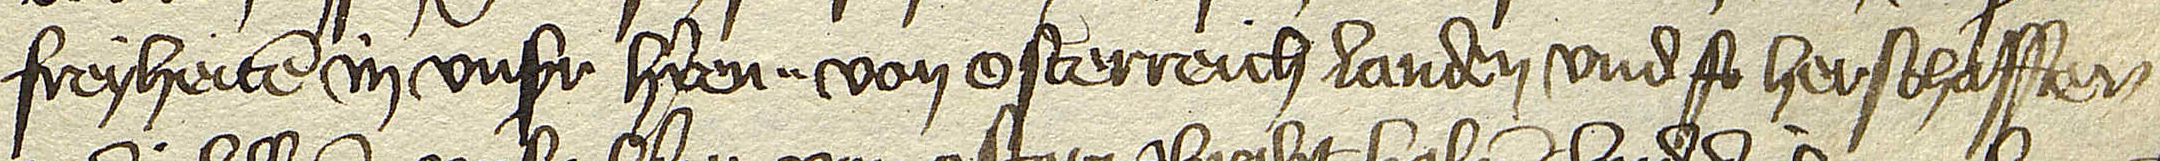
freyheite* in vnſ*r h*ren ~ von Oſterreich landen vnd ſ herſchafften
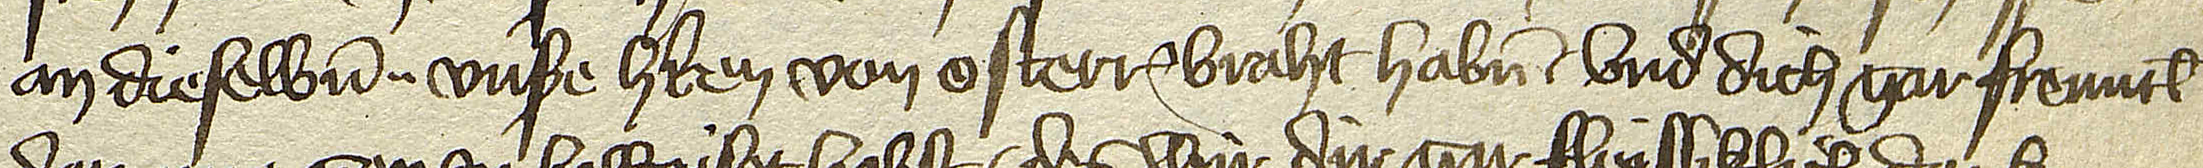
an dieſelbn* ~ vnſ*e h*ren von Oſterr* braht habn* / vnd dich gar freuntl*
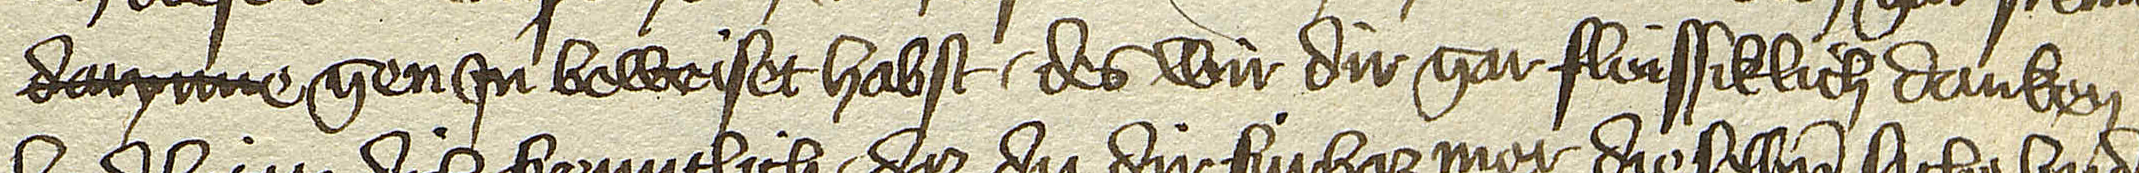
darynne gen In beweiſet habſt / des wir dir gar fleiſſiklich danken
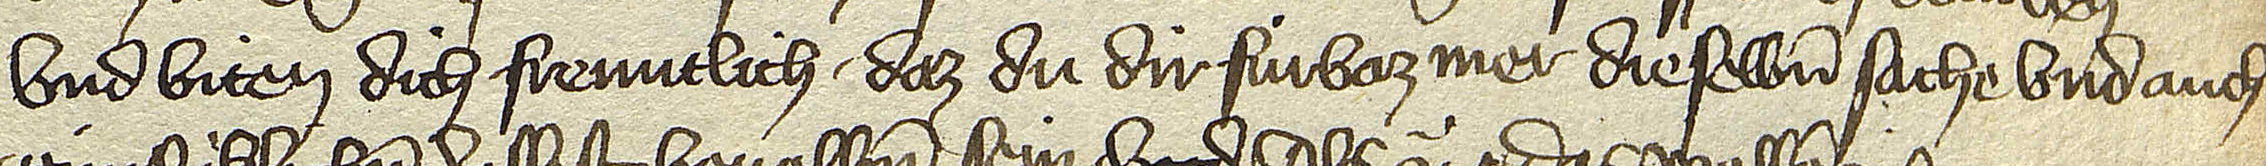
vnd biten dich freuntlich / daʒ du dir fürbaʒ mer dieſelbn* ſache vnd auch
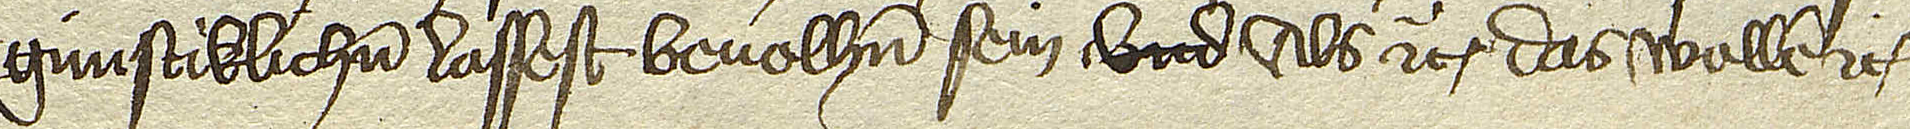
günſtiklichn* laſſeſt beuolhn* ſein / vnd Als ec* das wolle* ec*
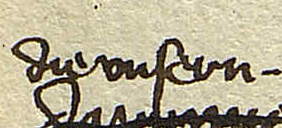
die vnſern
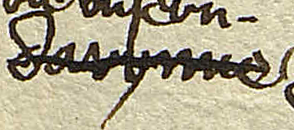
darynne /
